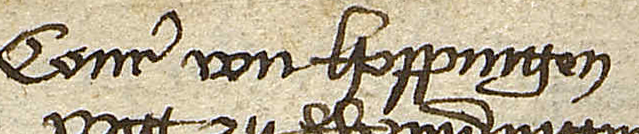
Conr* von Hoppingen
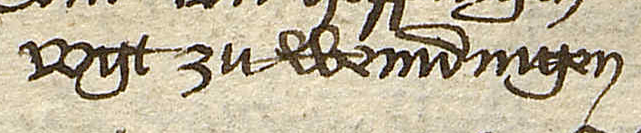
vogt ʒu Weindingen
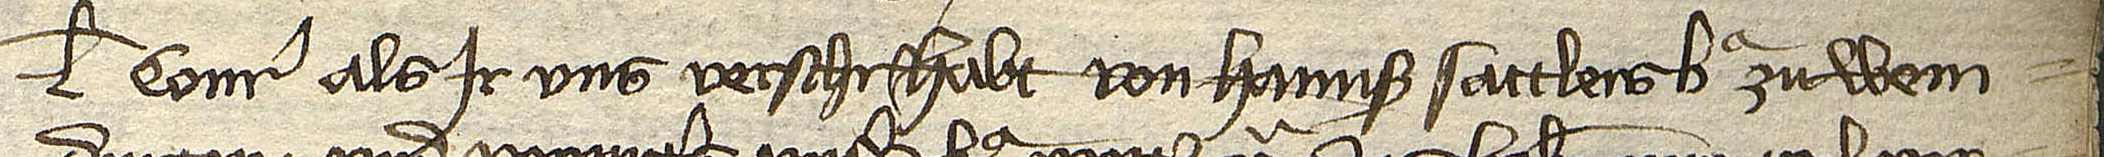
L* Conr* als Ir vns verſchr* habt von hannſ* ſattlers b* ʒu Wein =
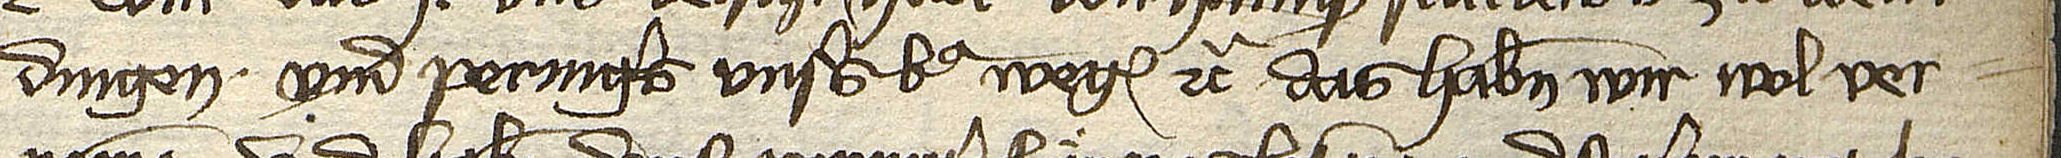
dingen / vnd pering*s vnſ*s b* weg* ec* / das habn* wir wol ver =
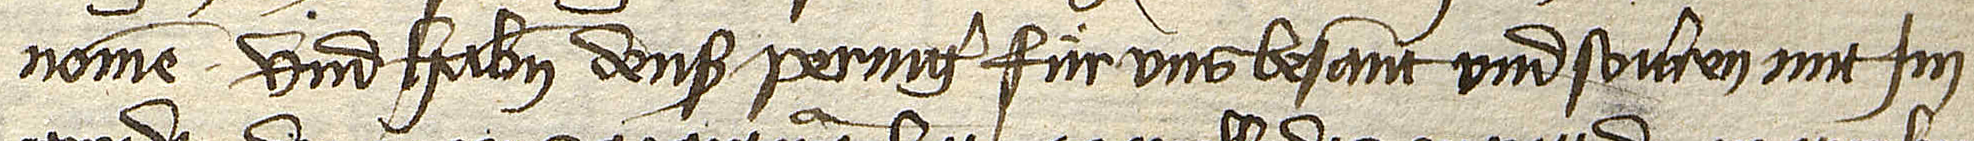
nome* / Vnd habn* denſ* pering* für vns beſant vnd ſou*ren mit Im
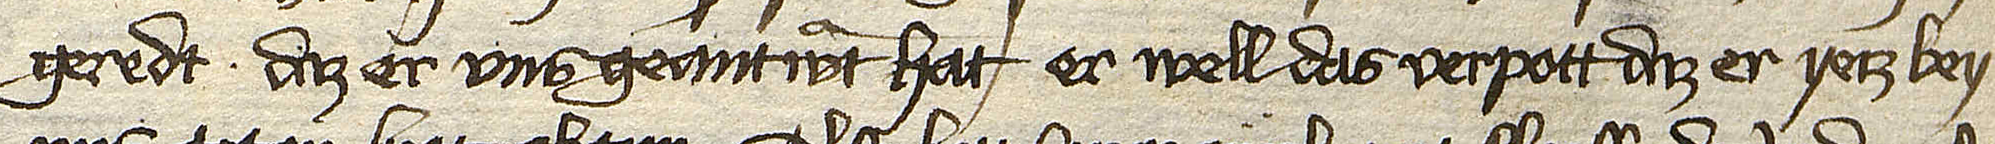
geredt . daʒ er vns geantw*t hat er well das verpott daʒ er yecʒ bey
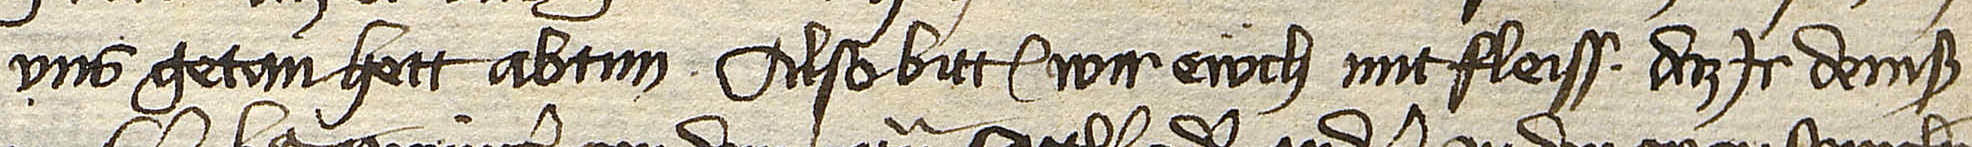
vns getan hett abtun . Alſo bitt* wir eẅch mit fleiſſ . daʒ Ir demſ*
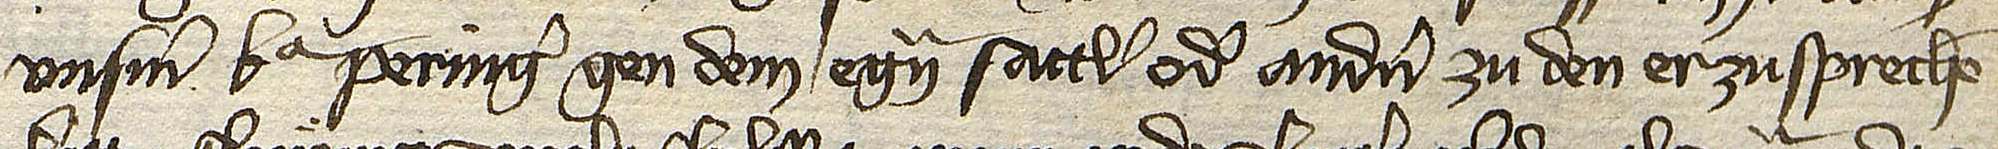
vnſm* b* pering* gen dem egn* ſattl* od* andn* ʒu den er ʒu ſpreche*
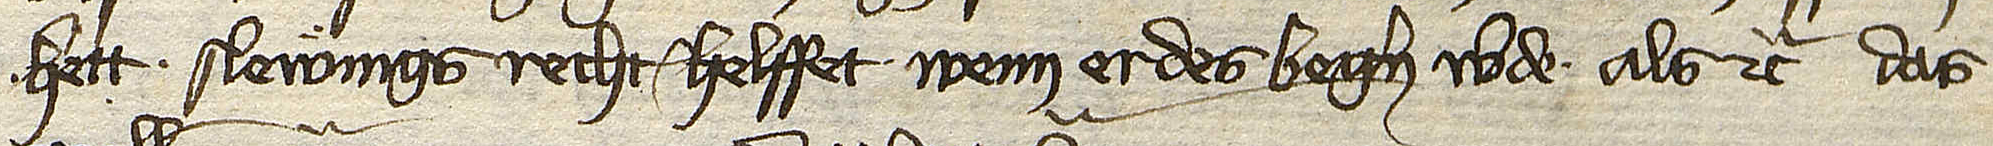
hett . ſleẅnigs recht* helffet . wenn er des beg*n w*de . als ec* das
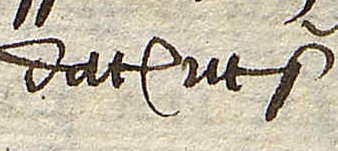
dat* ut ſ*
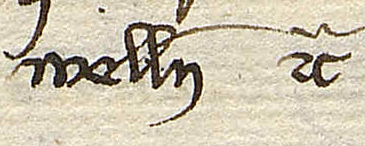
welln* ec*
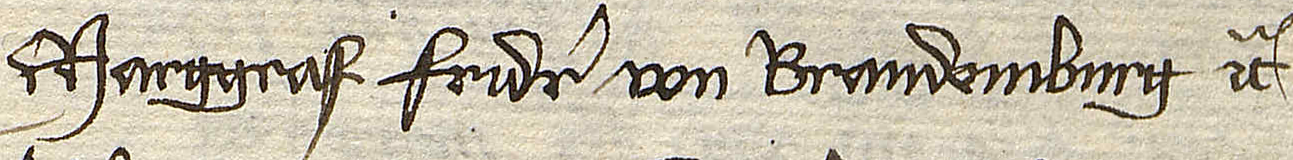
Marggraf fridr* von Brandemburg ec*
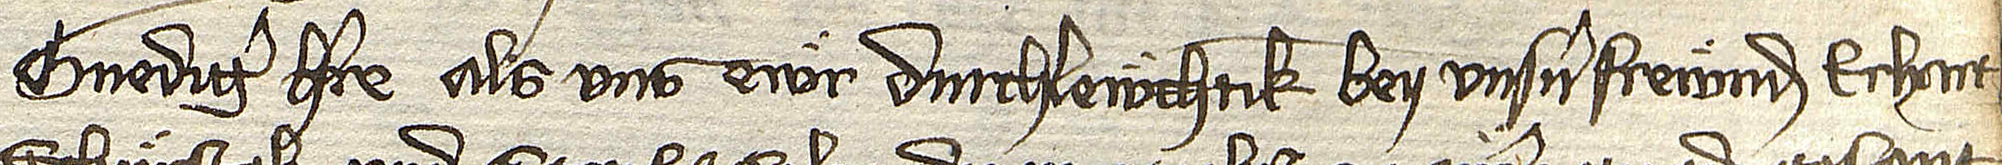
Gnedig* h*re als vns eẅr Durchleẅchtik* bey vnſn* freẅnd* Erhart
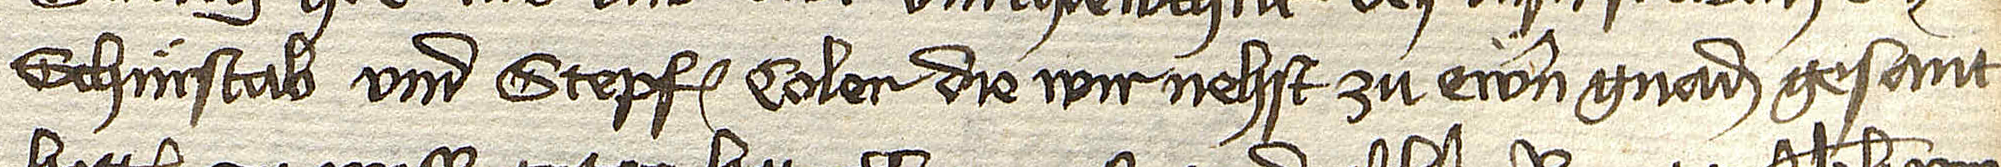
Schürſtab vnd Stepf* Coler die wir nehſt ʒu eẅ*n gnad* geſant
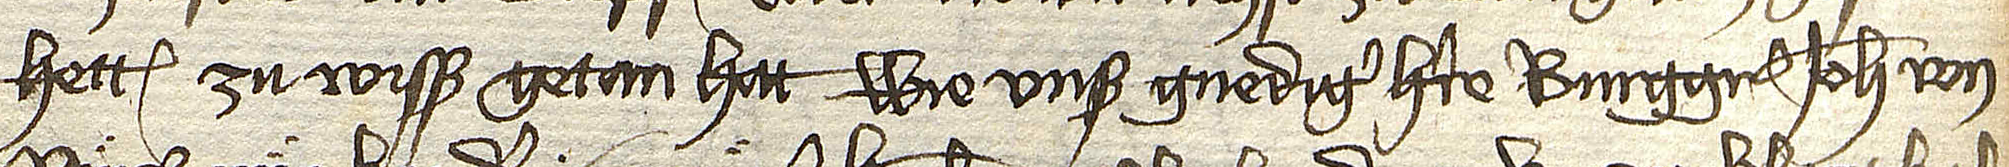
hett* ʒu wiſſ* getan hat wie vnſ* gnedig* h*re Burggr* Ioh* von
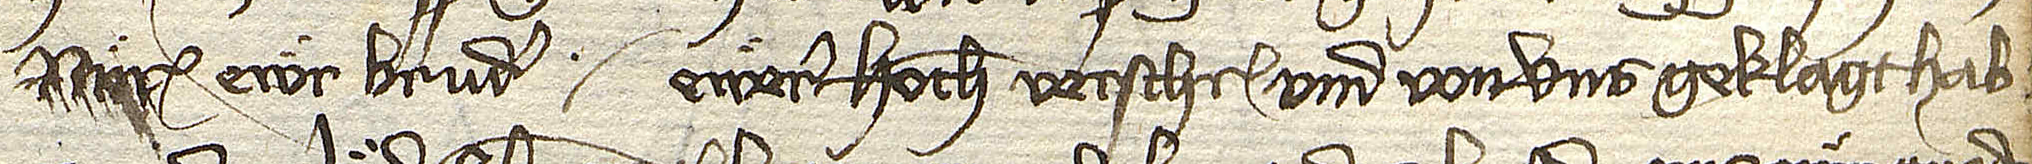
Nür* eẅr brud* . / eẅer* hoch* verſchr* von vns Vns geklagt hab
